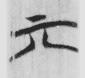亓
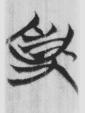事
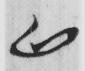㠯（以）
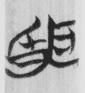䎽
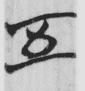五
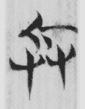兵
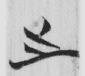之
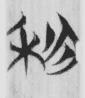利
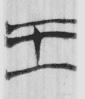王
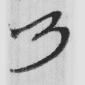乃
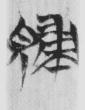{見帚}
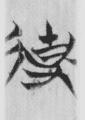𫹒
